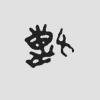{𨊥糸女}
